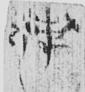邦
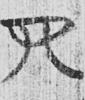四
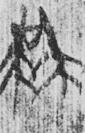益
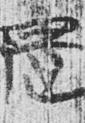是
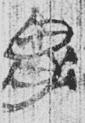{胃刀}（謂）
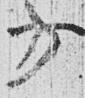方
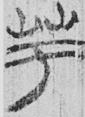芋（華）
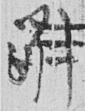唯（雖）
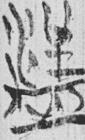○（盈）
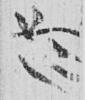必
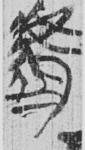虛
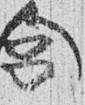宮
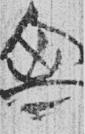室
